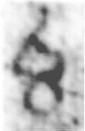玄
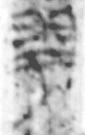○（羽）
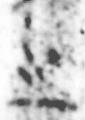之
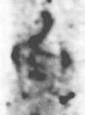首
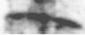一
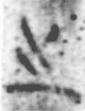之
